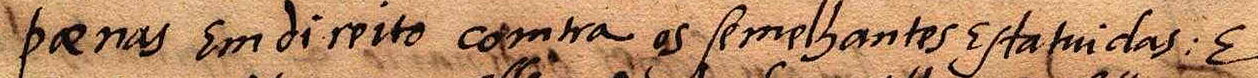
pœnas Em direito comtra os semelhantes Estatuidas: E
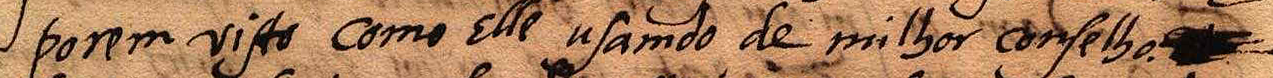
porem visto como Elle usamdo de milhor conselho.
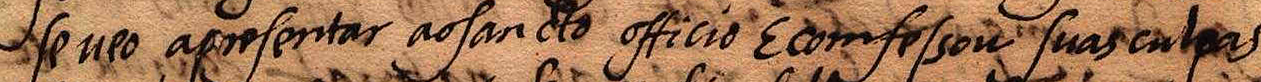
se ueo apresentar ao sancto officio E comfessou suas culpas
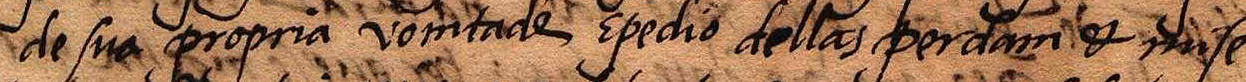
de sua propria vomtade E pedio dellas perdam & mise
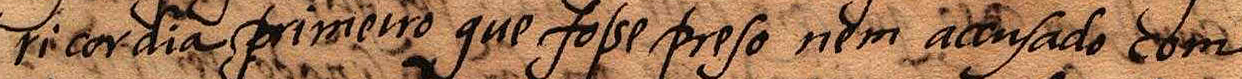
ricordia primeiro que fosse preso nem accusado com
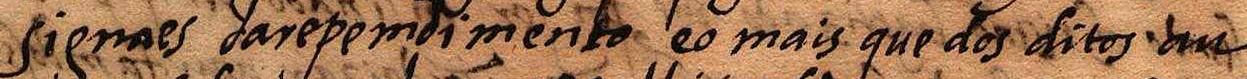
signaes darepemdimento e o mais que dos ditos au
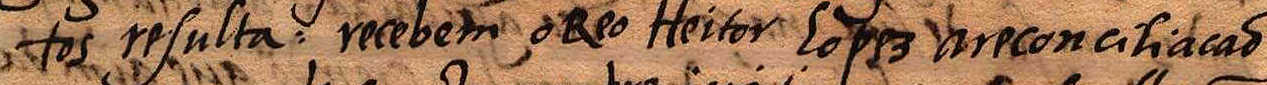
tos resulta: recebem o Reo Heitor lopez a reconciliaçaõ
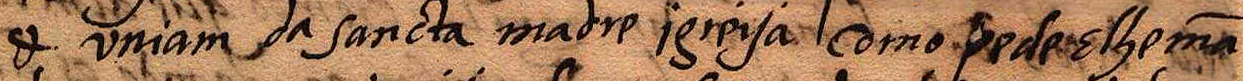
& vniam da sancta madre igreija como pede E lhe mā
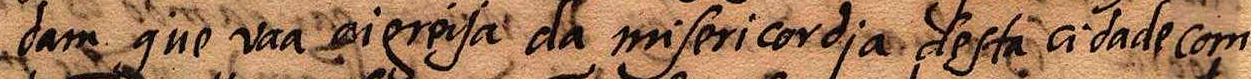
dam que vaa a igreija da misericordja desta cidade com
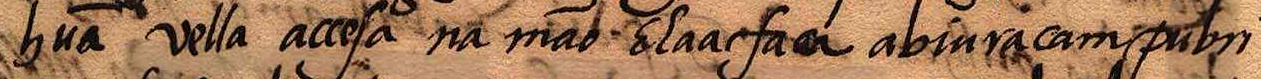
huā vella accesa na mão E laa faça abiuraçam pubri
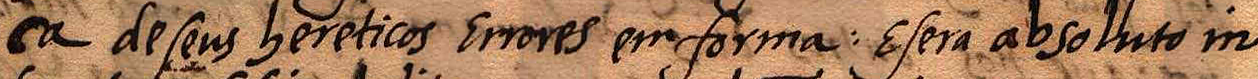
ca de seus hereticos Errores em forma: E sera absoluto in
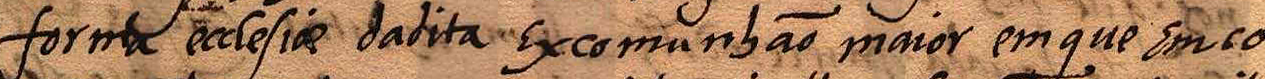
forma ecclesiæ da dita Excomunhão maior em que Emco
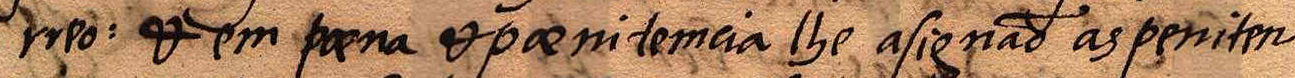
rreo: & em pœna & pœnitemcia lhe asignaõ as peniten
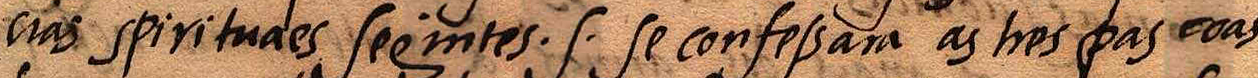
cias spirituaes segintes .s. se confessara as tres pascoas
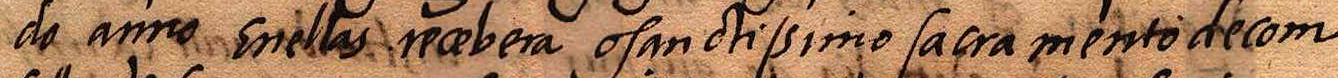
do anno E nellas recebera o sanctissimo sacramento de com
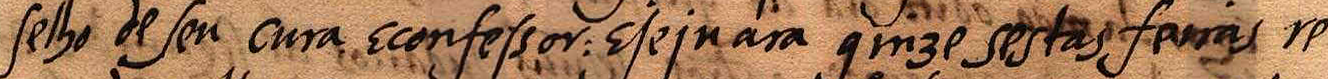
selho de seu cura E confessor: E jejuara qinze sestas feiras re
